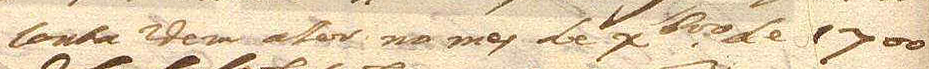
conta Vem a ter no mes de xbro de 1700
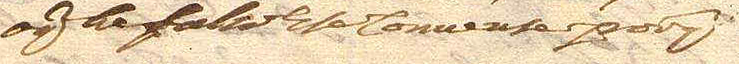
o q̄ lhe falla E se conuense porq̄
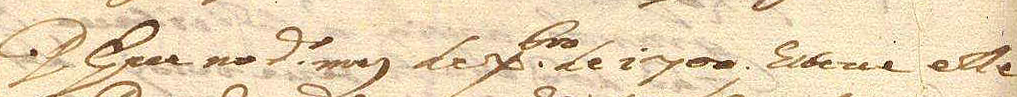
P. Que no d.o mes de x.ro de i700. Esteue elle
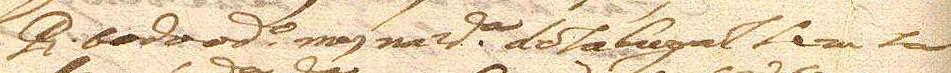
R. todo o d.o mes na V.a do sabugal sem la
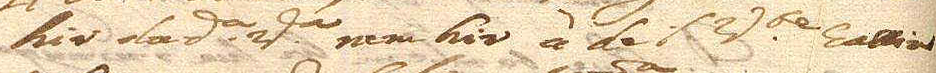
hir da da V.a nem hir á de S. V.te E assim
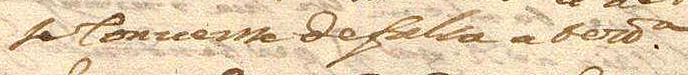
se Conuense de falsa a test.a
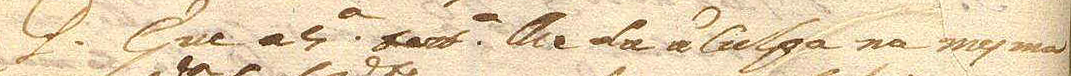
P. Que a 5a. test.a lhe da á Culpa na mesma
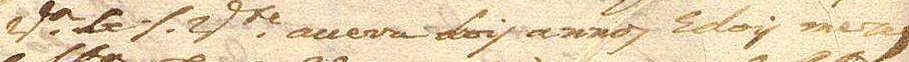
V.a de S. V.te auera dois annos E dois mezes
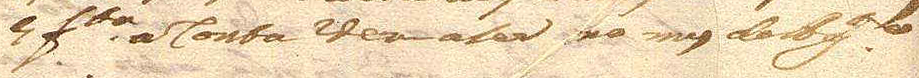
E fta. a Conta Vem a ser no mes de Ag.to
